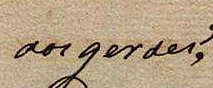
aos geraes;
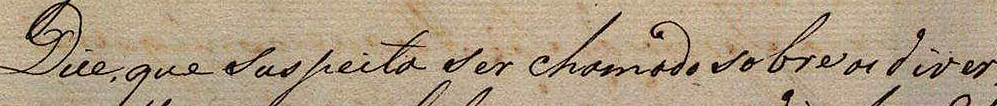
Dice, que suspeita ser chamado sobre as diver
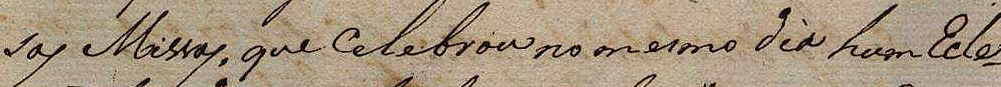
sas Missas, que celebrou no mesmo dia hum Ecle
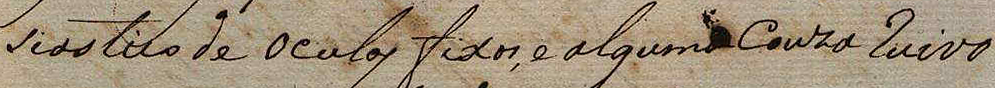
siastico de oculos fixos, e alguma couza Ruivo
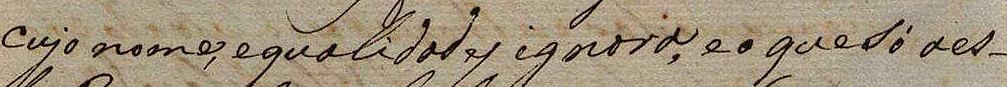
cujo nome, e qualidades ignora, e o que só a es
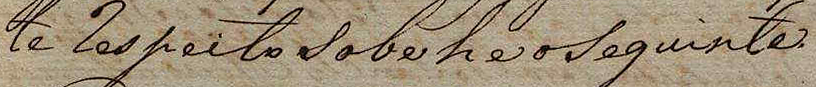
te Respeito sabe he o seguinte.
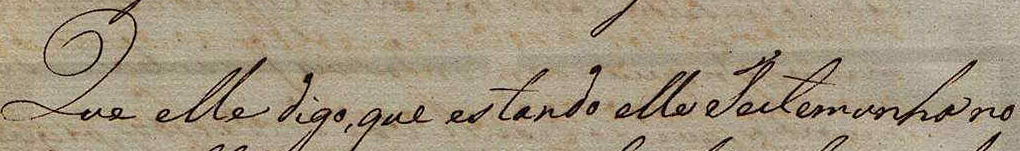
Que elle digo, que estando elle Testemunha no
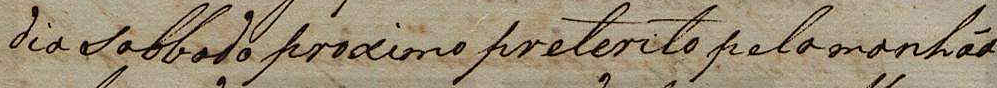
dia sabbado próximo preterito pela manhãa
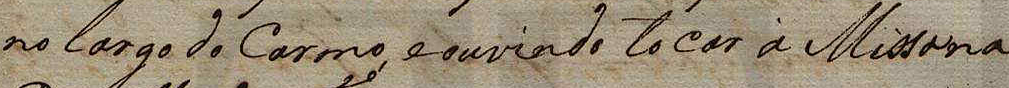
no largo do Carmo, e ouvindo tocar à Missa na
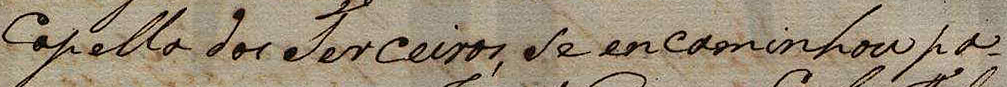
Capella dos Terceiros, se encaminhou pa
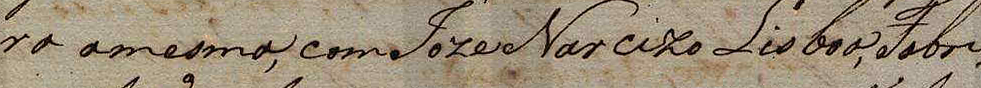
ra a mesma, com Ioze Narcizo Lisboa, Fabri
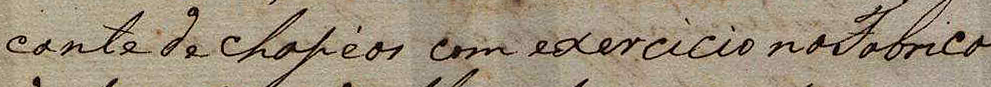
cante de chapéos com exercicio na Fabrica
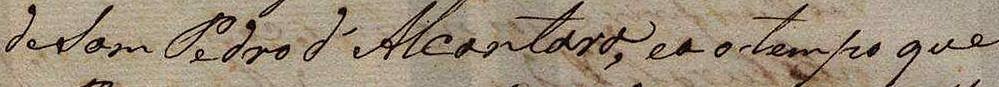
de Sam Pedro d’Alcantara, e a o tempo que
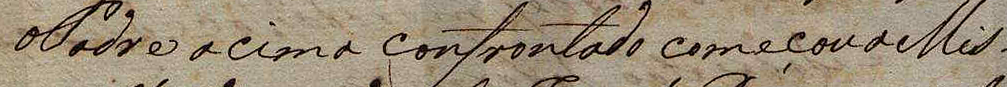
o Padre acima confrontado começou a Mis
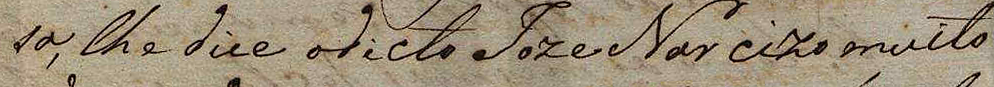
sa, lhe dice o dicto Ioze Narcizo muito
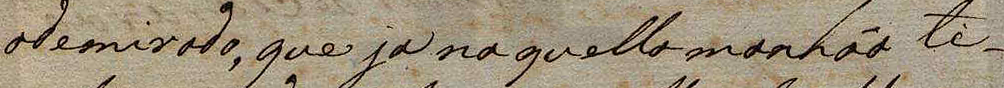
ademirado, que ja naquella manhãa ti
